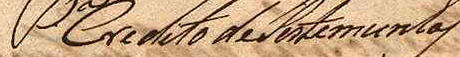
Pa Credito de Testemunhas
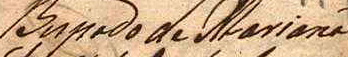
Bispado de Mariana
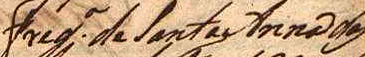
freg.a de Santa Anna das
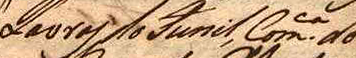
Lavras do Funil, Com.ca do
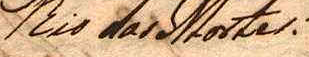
Rio das Mortes:
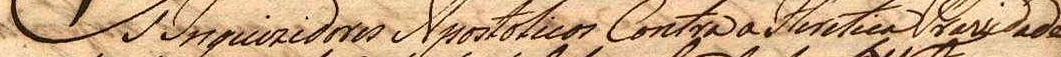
Os Inquizidores Apostolicos Contra a Heretica Pravidade,
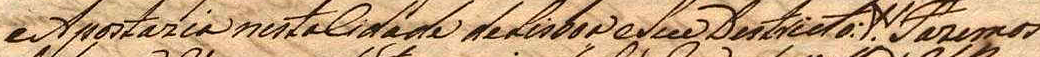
e Apostazia nesta Cidade de Lisboa e Seu Destricto: Etc. Fazemos
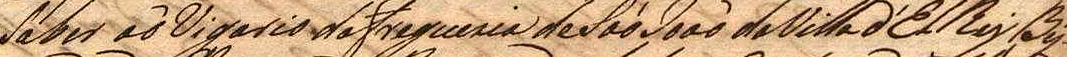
Saber ao Vigario da freguezia de Saõ Joaõ da Villa d´El Rey Bis
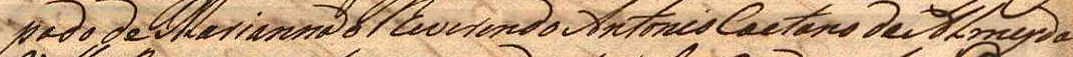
pado de Marianna o Reverendo Antonio Caetano de Almeyda
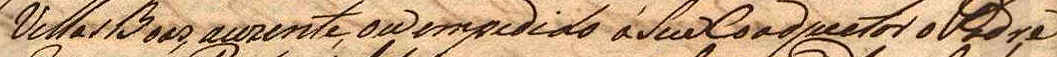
Villas Boas, auzente, ou empedido á Seu Coadjutor o Padre
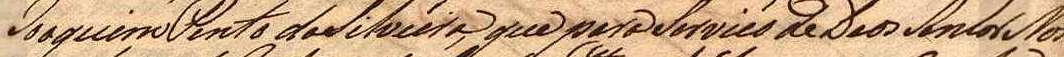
Ioaquim Pinto da Silveira, que para Servico de Deos Senhor Nos
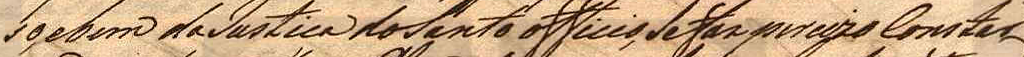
so, e bem da Iustiça do Santo officio, se faz percizo Constar
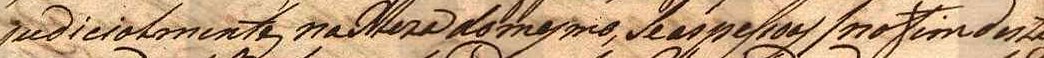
judicialmente na Meza do mesmo, Se as pessoas / no fim deste
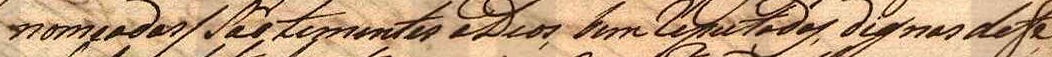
nomeadas / São tementes a Deos, bem Reputadas, dignas de fe,
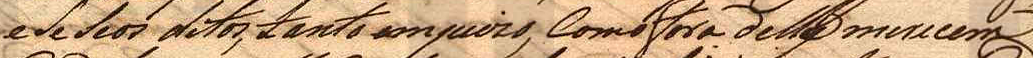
e se seos ditos, tanto em juizo, como fora delle merecem
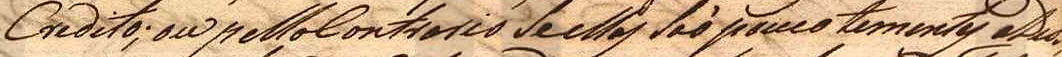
Credito; ou pello Contrario se ellas saõ pouco tementes a Deos,
